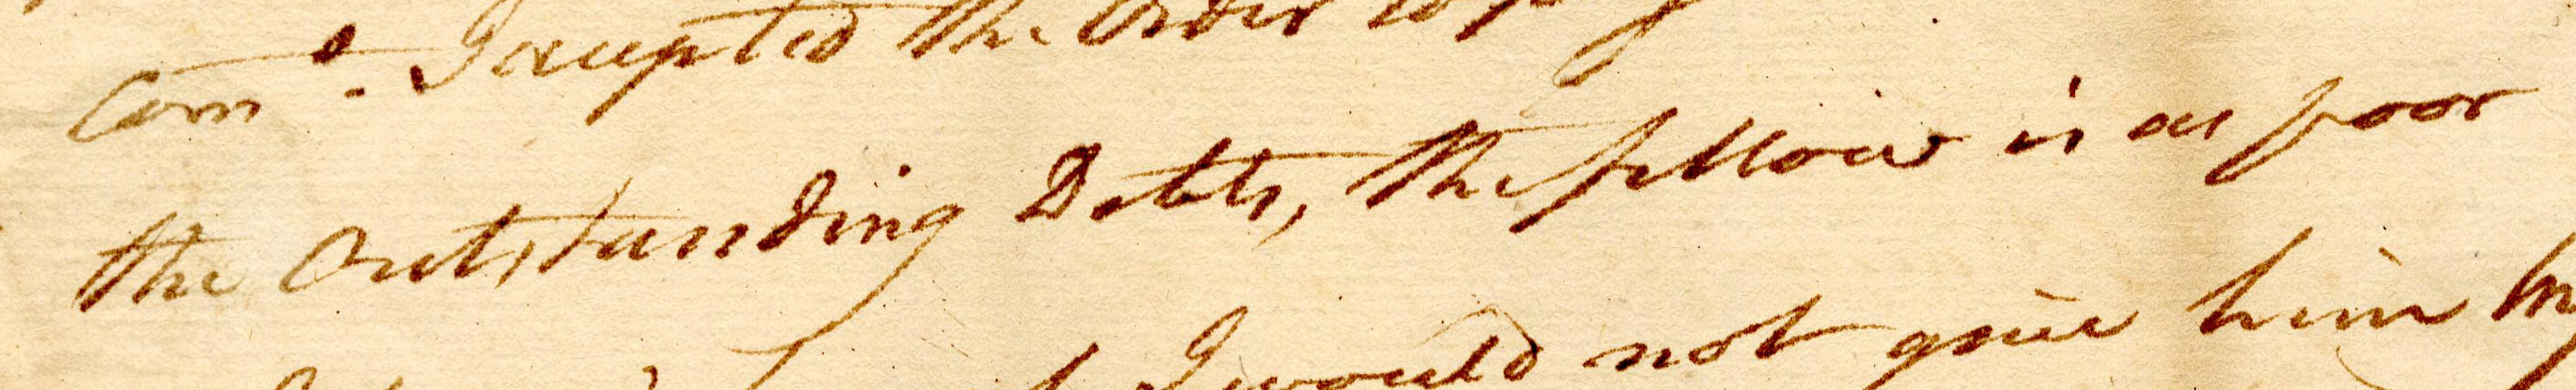the Outstanding Debts, the fellow is as poor
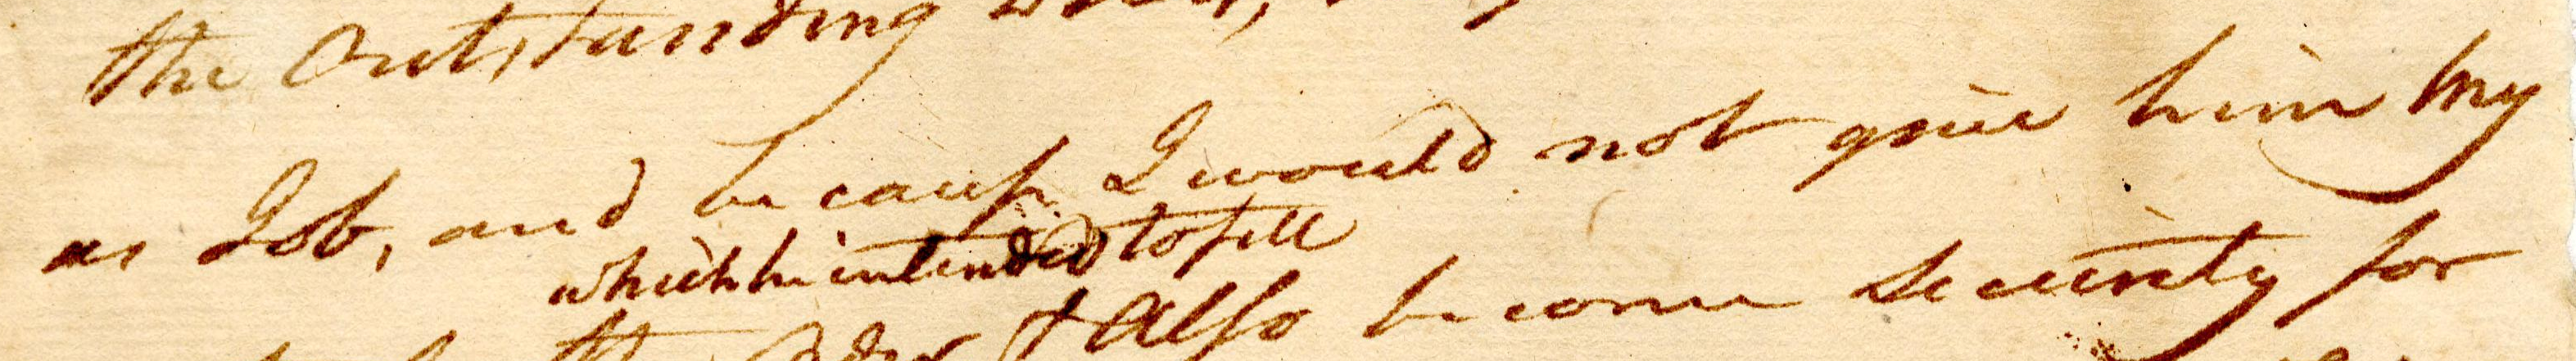as Job, and be cause I would not give him my
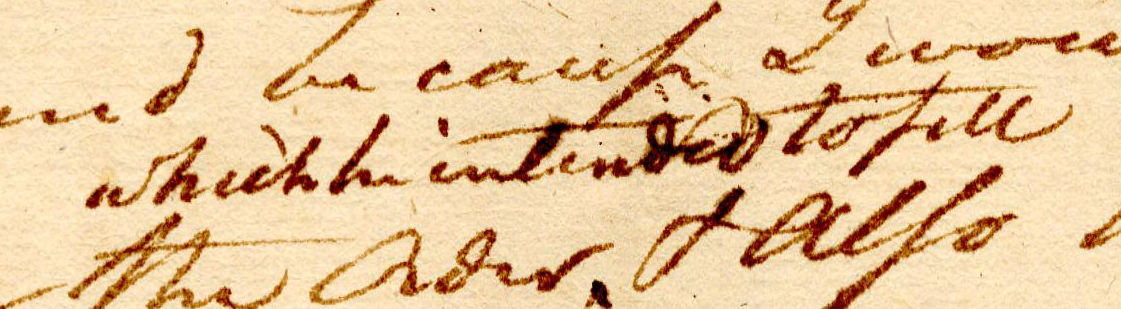whic he intended to fill
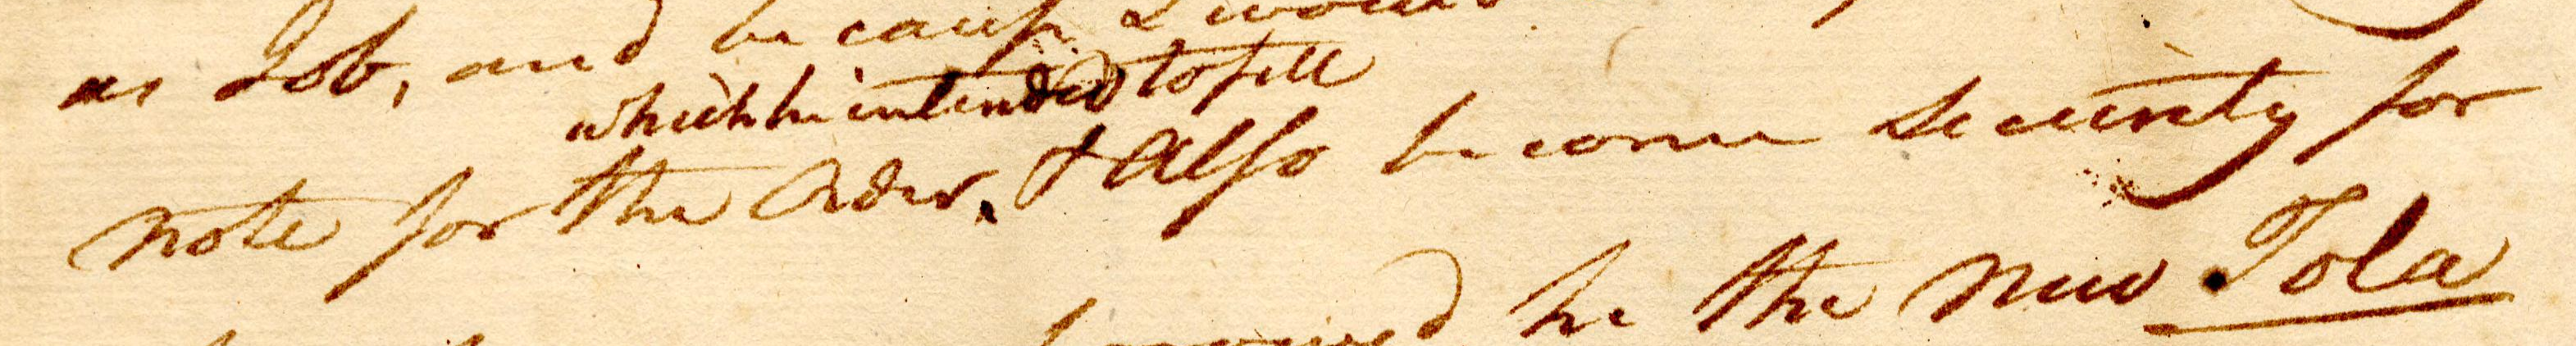note for the Order ^ & Also because security for
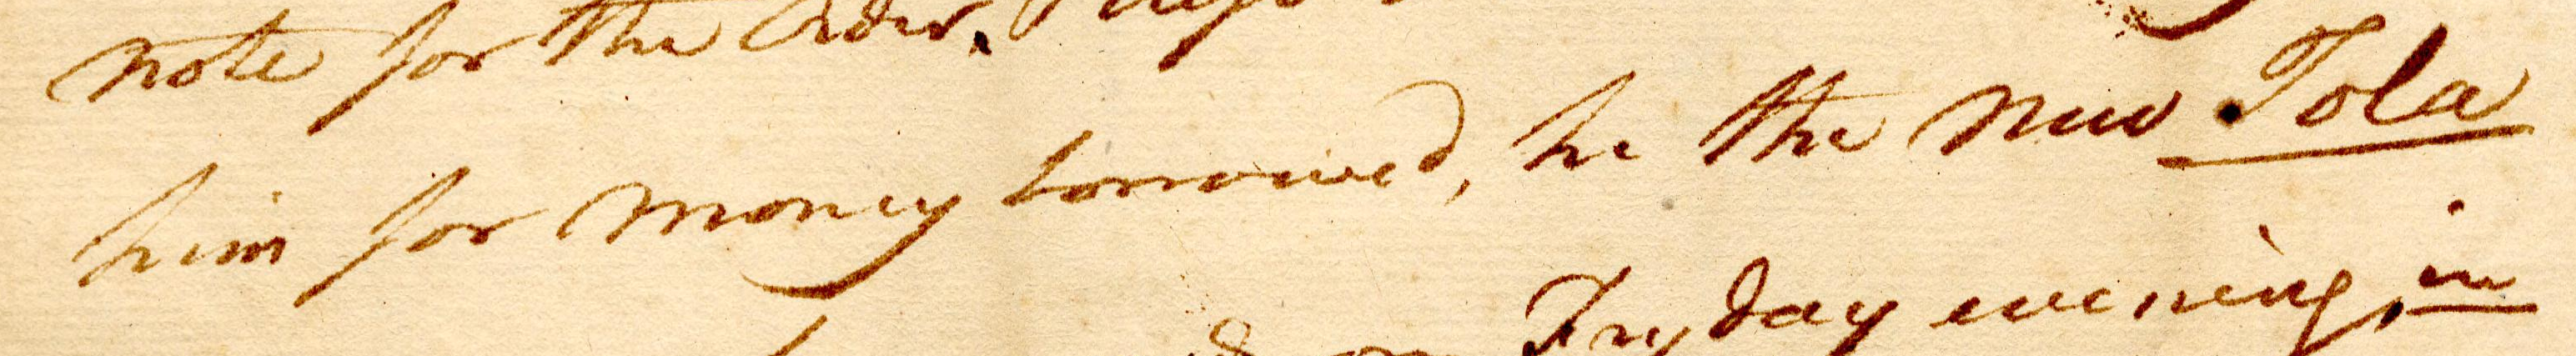him for money forward, he the news Tola
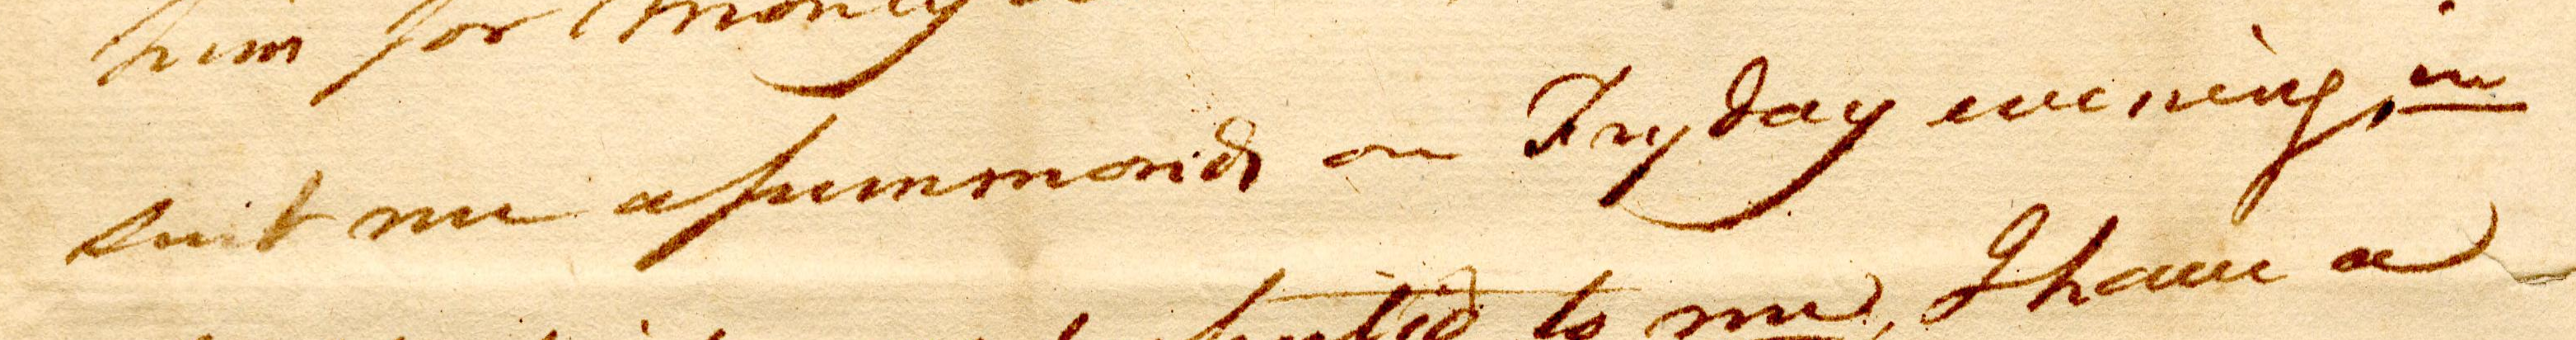sent me a summonds an Fry day evening in
